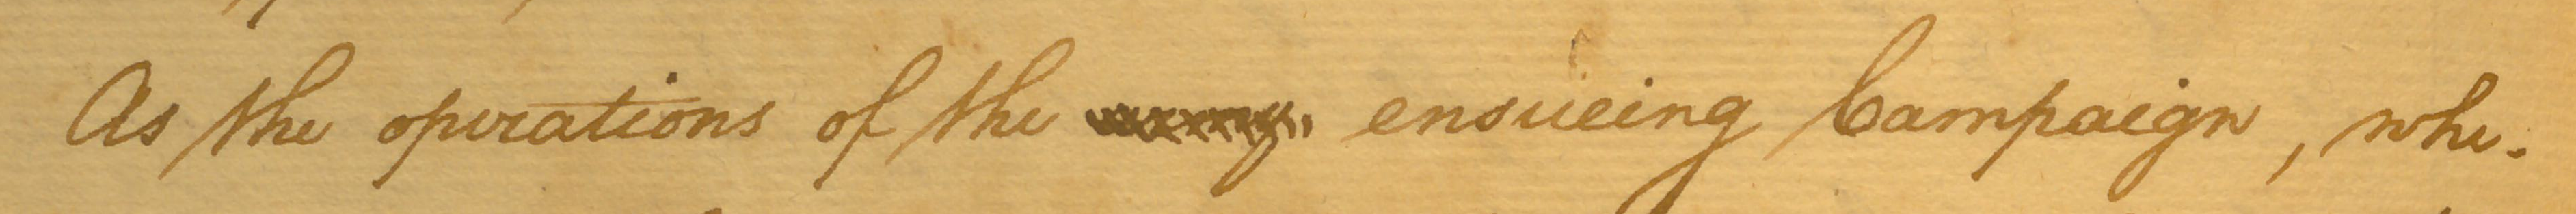As the operations of the [____] ensueing Campaign, whe-
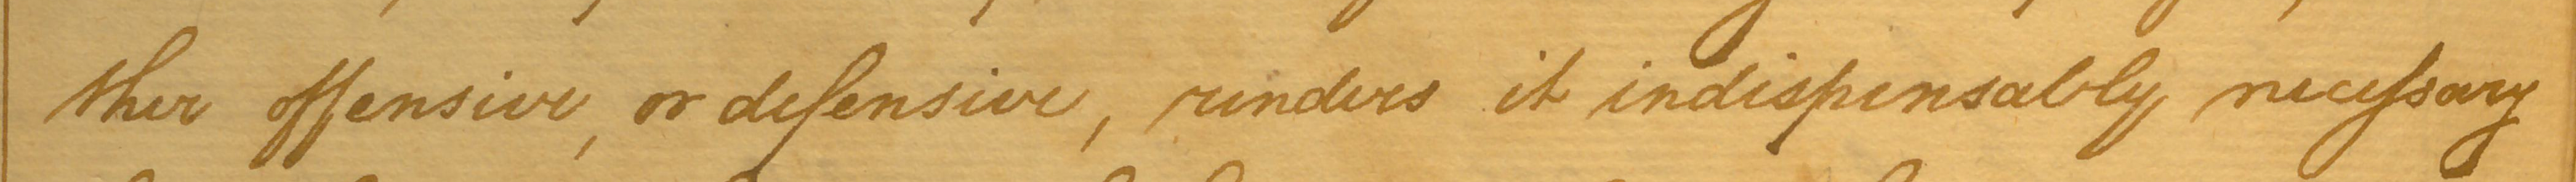ther offensive, or defensive, renders it indispensably necessary
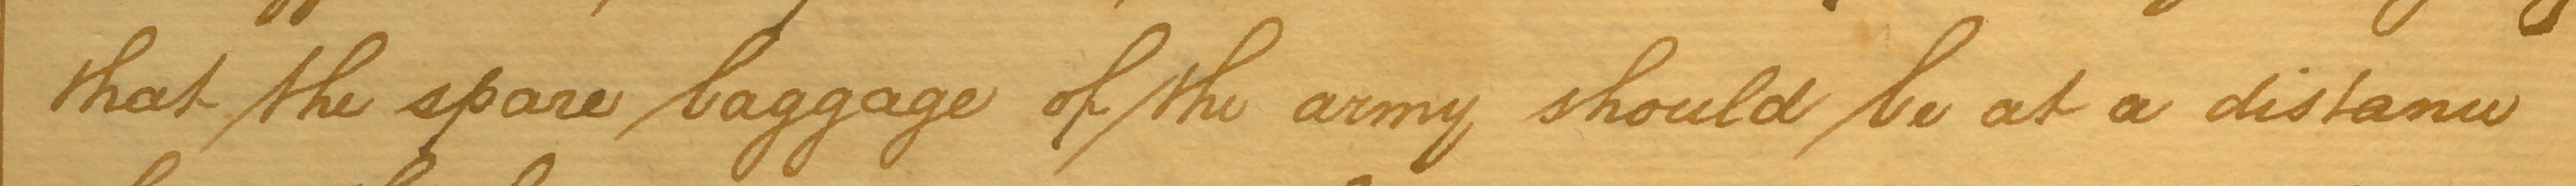that the spare baggage of the army should be at a distance
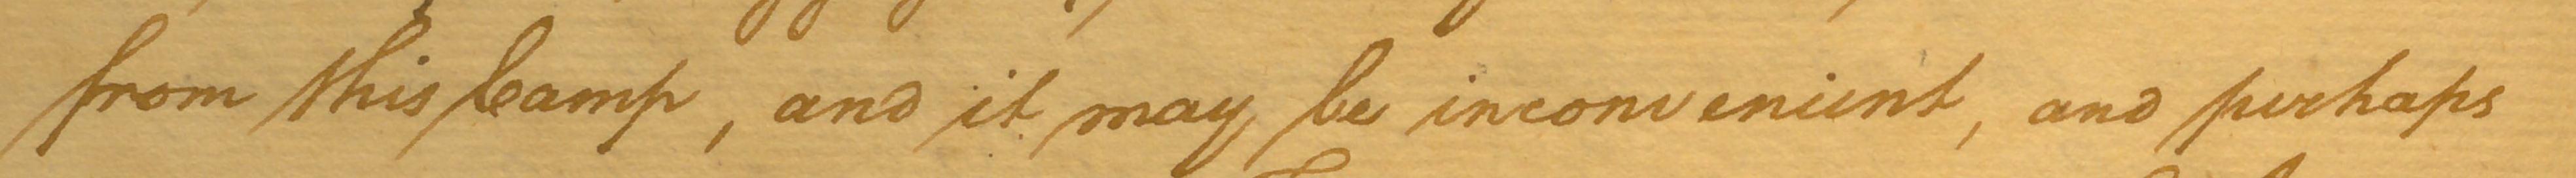from this Camp, and it may be inconvenient, and perhaps
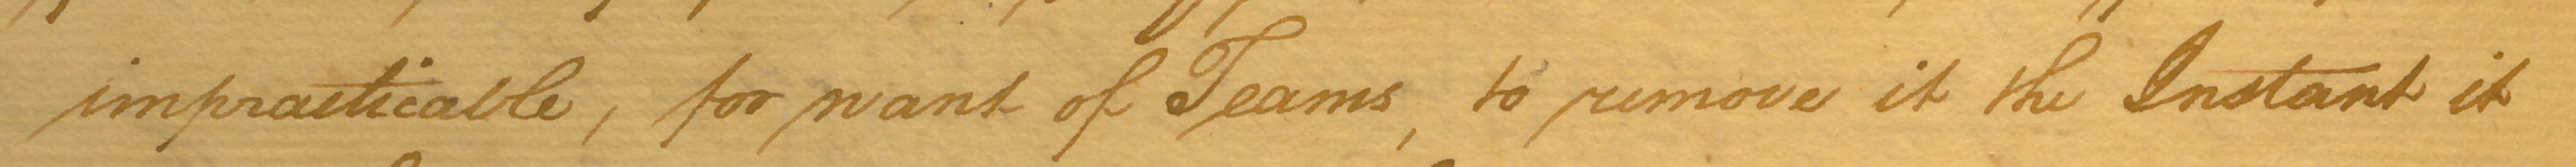impracticable, for want of Teams, to remove it the Instant it
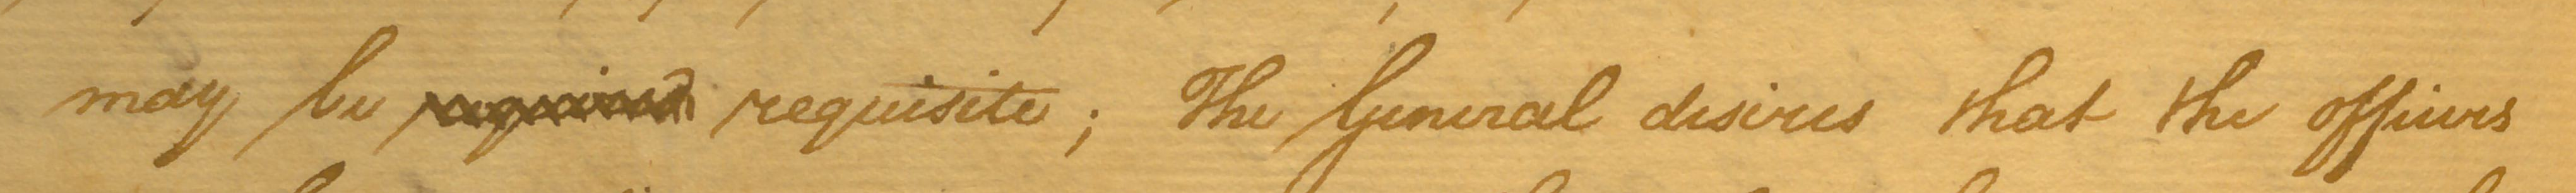may be [required] requisite; The General desires that the officers
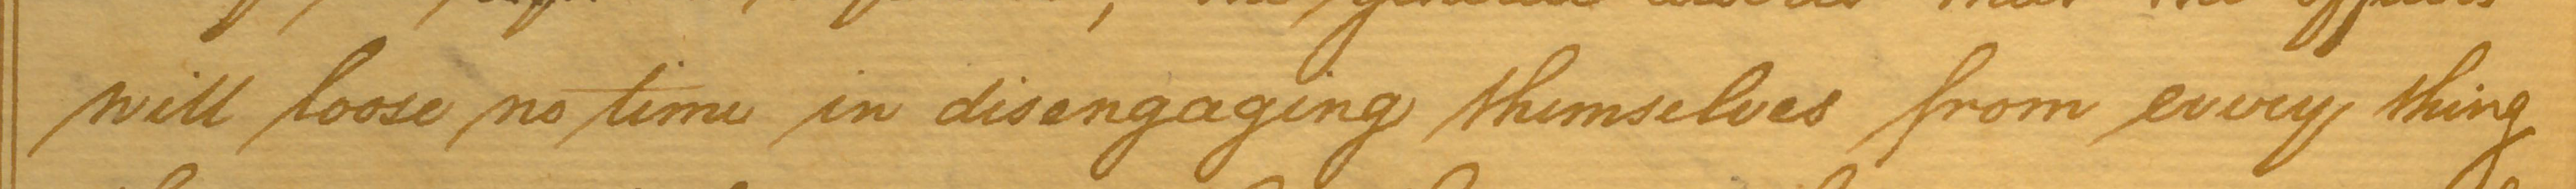will loose no time in disengaging themselves from every thing
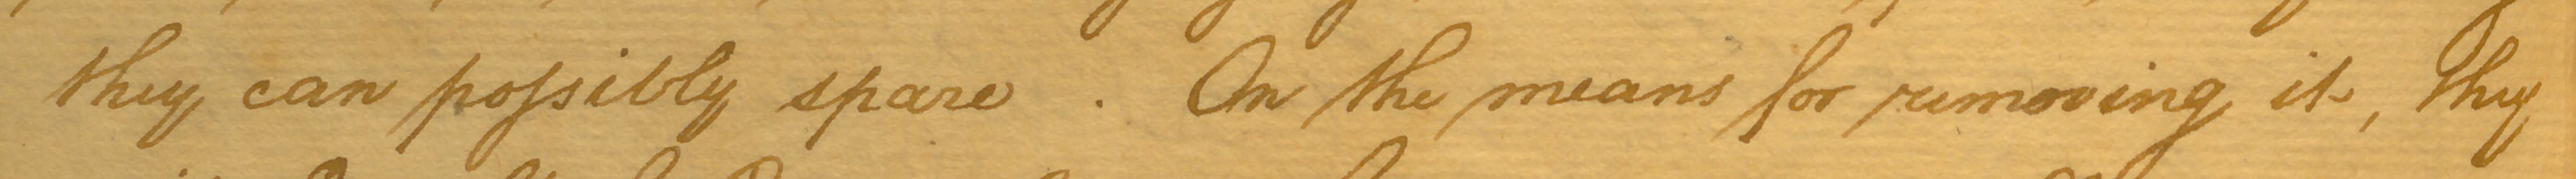they can possibly spare. On the means for removing it, they
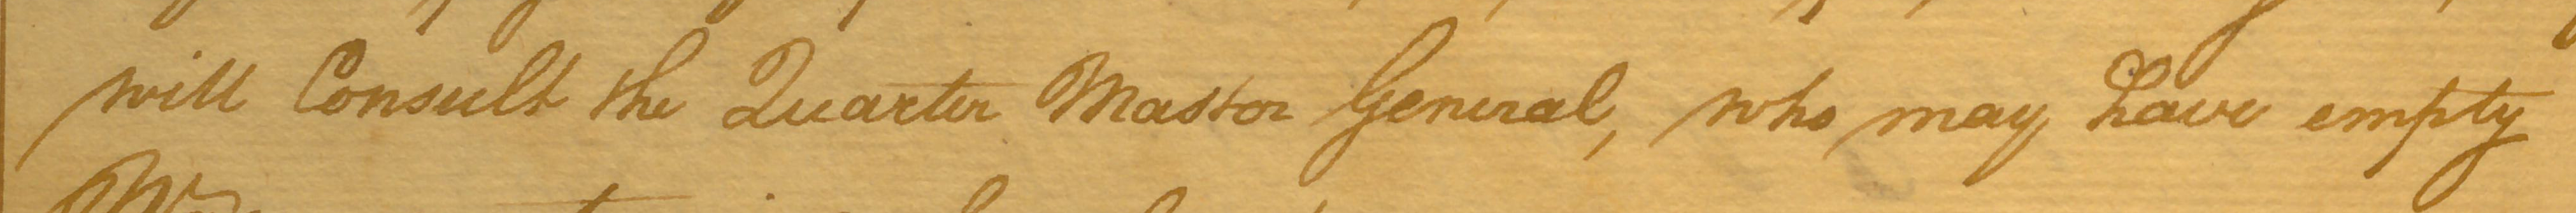will Consult the Quarter Master General, who may have empty
